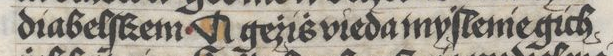diabelſkem.A geżíṡ vieda myẛleníe gich
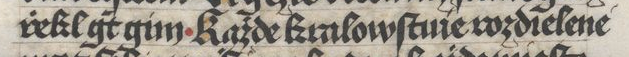ṙekl ḡt gim.Każde kralowſtuie rozdielené
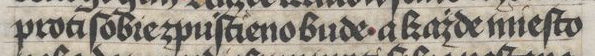proti ſobie zpuẛtieno bude.a każde mieſto
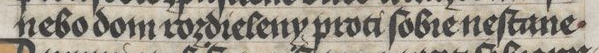nebo dom rozdieleny proti ſobie neſtane.
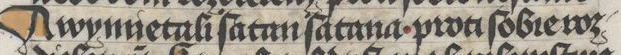A wymietali ẛatan ẛatana.proti ſobie roz¬
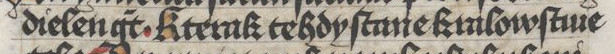dielen ḡt.Kterak tehdy ſtane kralowſtuíe
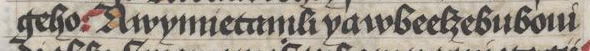geho?A wymietamli ya wbeelzebuboui
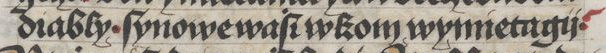diably.ſynowe waẛi wkom wymietagij?
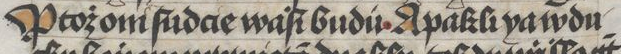Ꝓtoż oni ſudcie waẛi budú.A pakli ya wdu¬
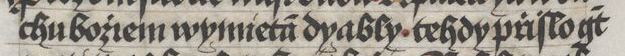chu bożiem wymietā dyably.tehdy pṙiẛlo ḡt.
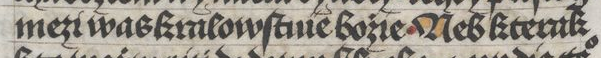mezi was kralowſtuie bożie.Neb kterak
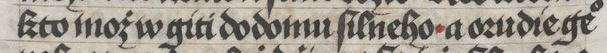kto moż w gíti dodomu ſilneho.a orudíe geo
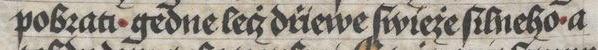pobrati.gedne lecż dṙíewe ſwieże ſilneho.a
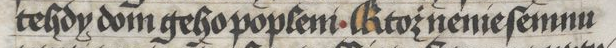tehdy dom geho poplení.Ktoż neníe ſemnu
